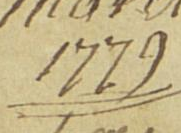1779
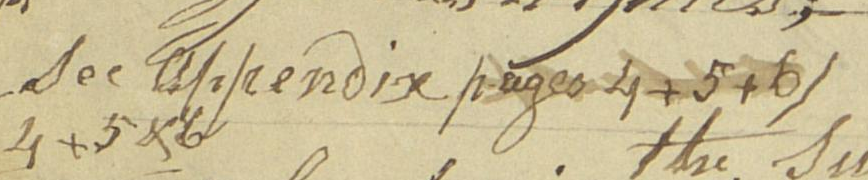See Appendix pages 4+5+6)
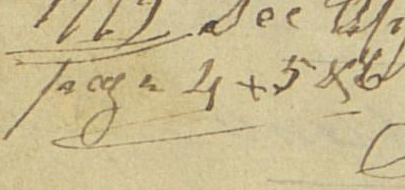Page 4 + 5 + 6
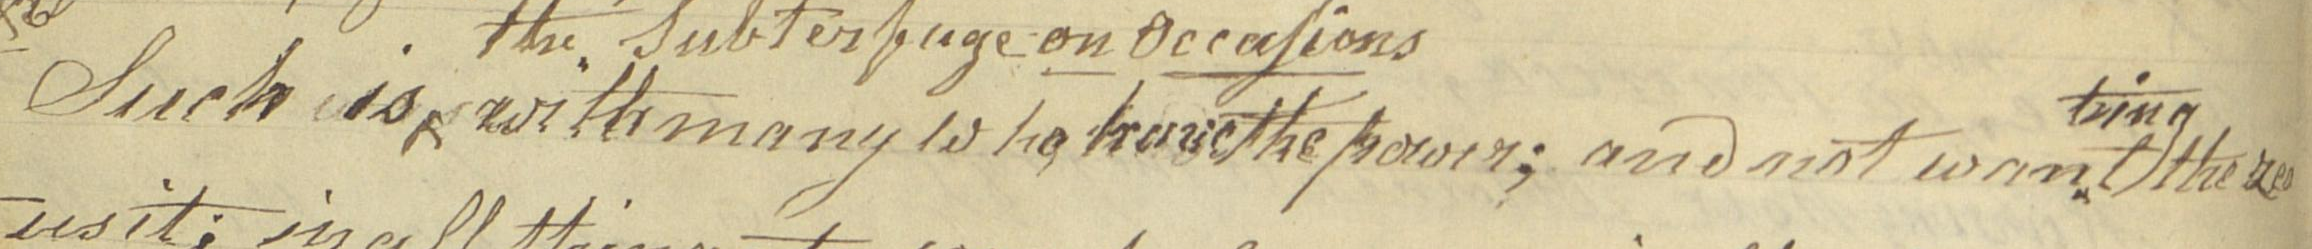Such is ^ with many who have the power; and not want ^ there
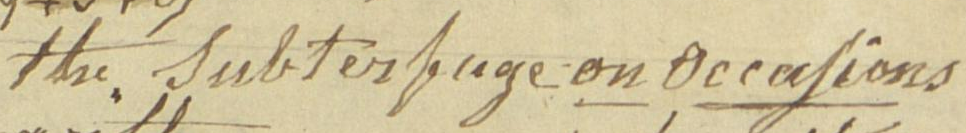the Subterfuge on Occasions
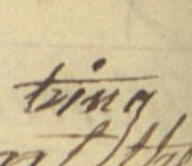-ting
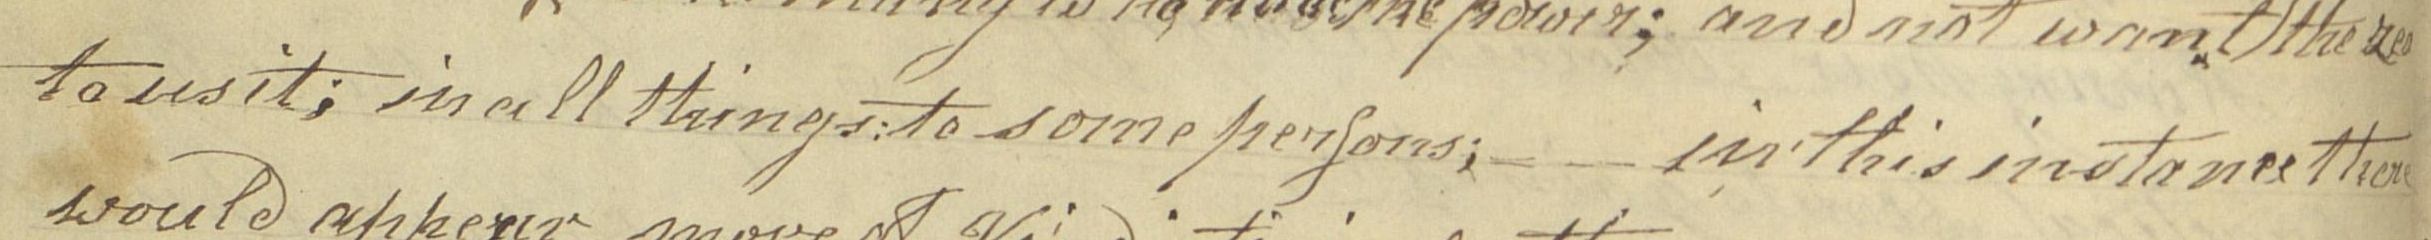to visit; in all things to some persons; in this instance there
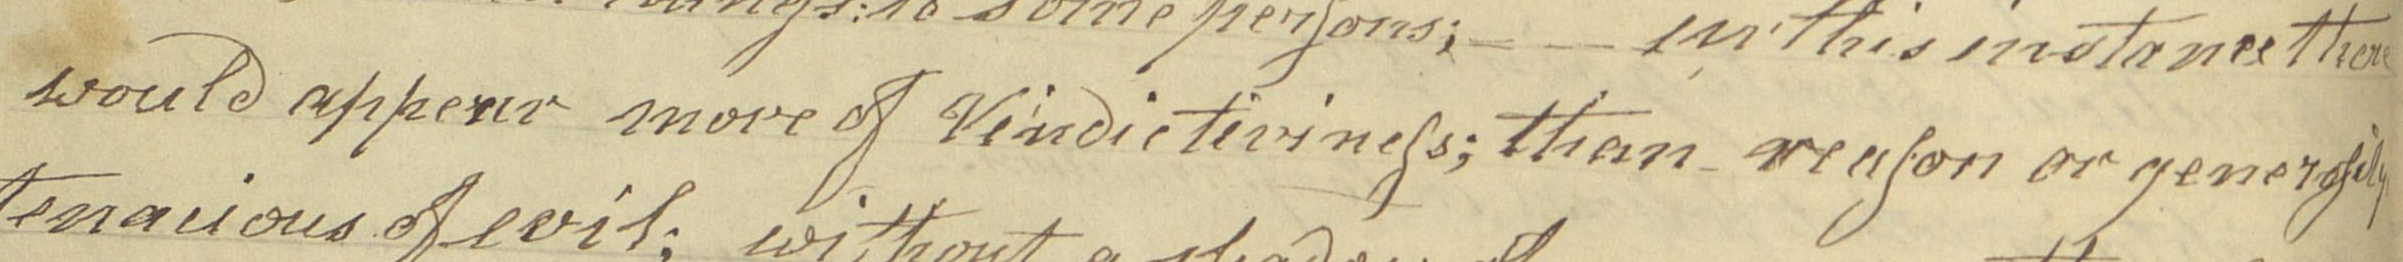would appear more of Vindictiviness; than reason or genera-
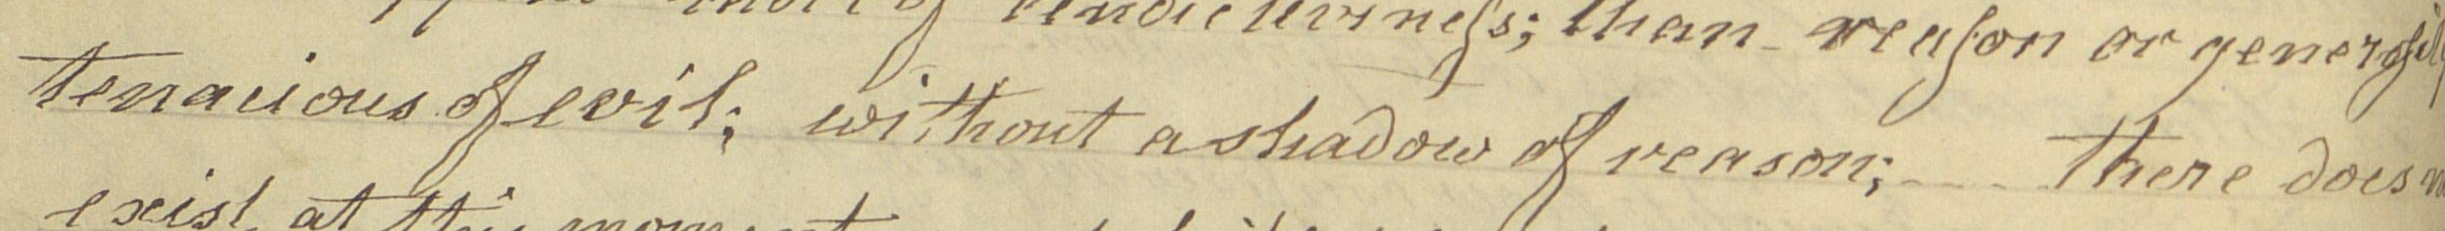tenacious of evil: without a shadow of reason; There does n-
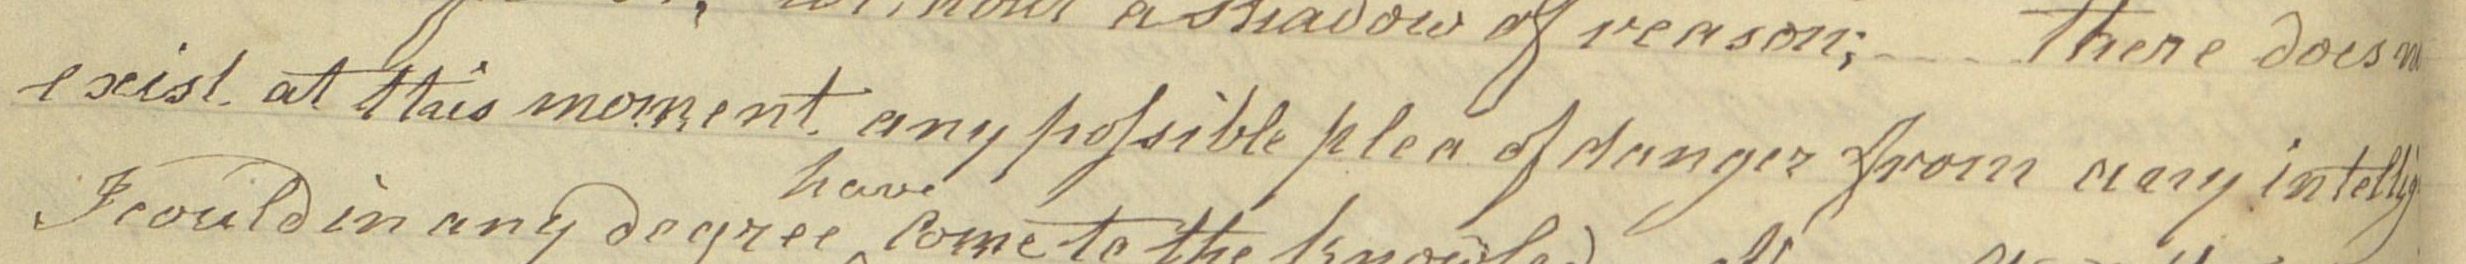exist at This moment any possible plea of danger from any intell-
